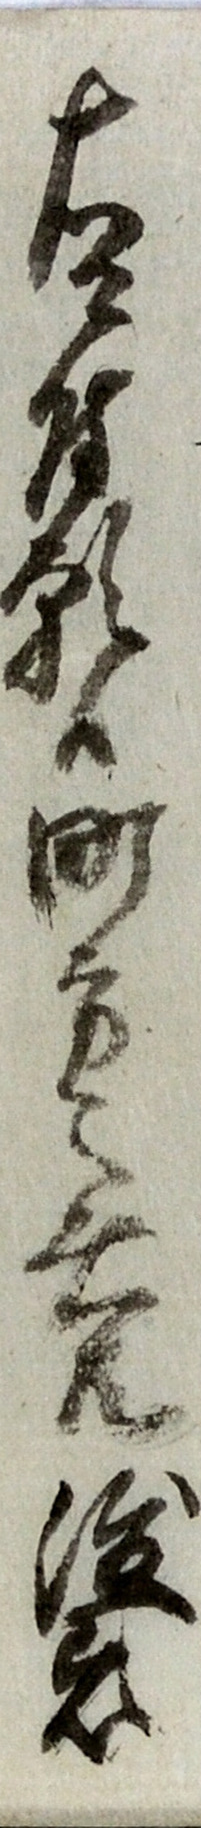右ニ付願候町方之者共渡着
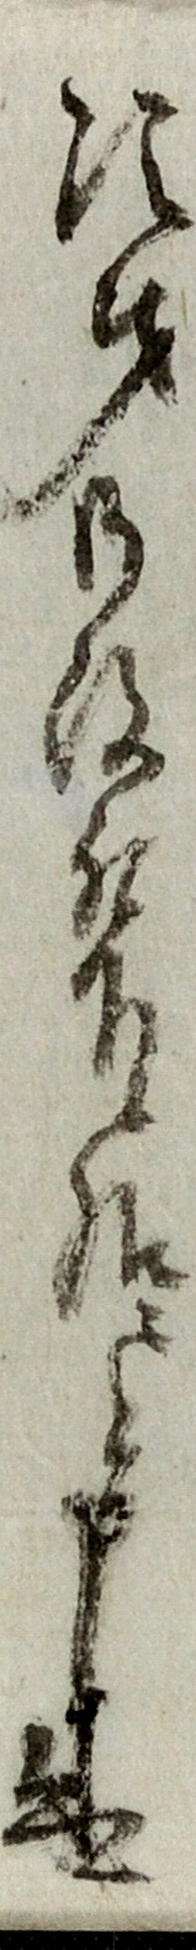次第御改被下候様ニと申来候
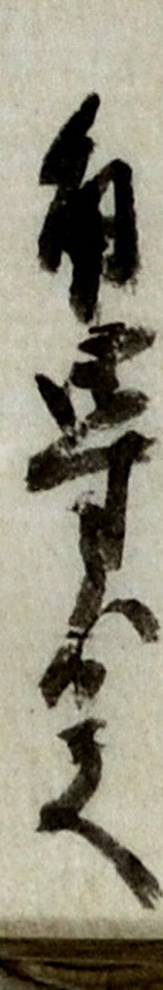角四寸ゟ尺

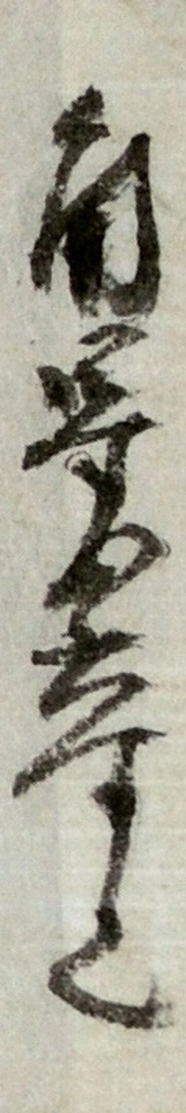角四寸ゟ六寸迄
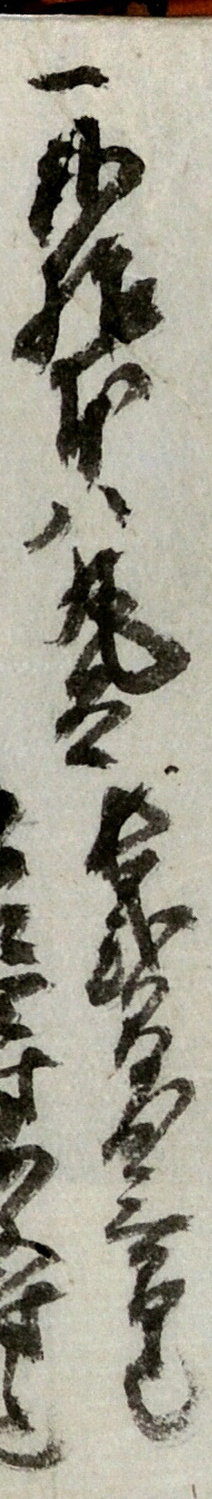一弐拾本ハ丸太長弐間ゟ三間也
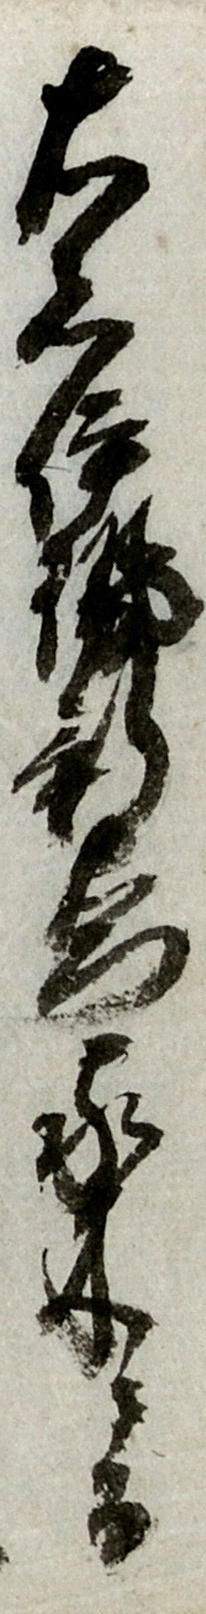右は伊那郷新右衛門家木ニ而
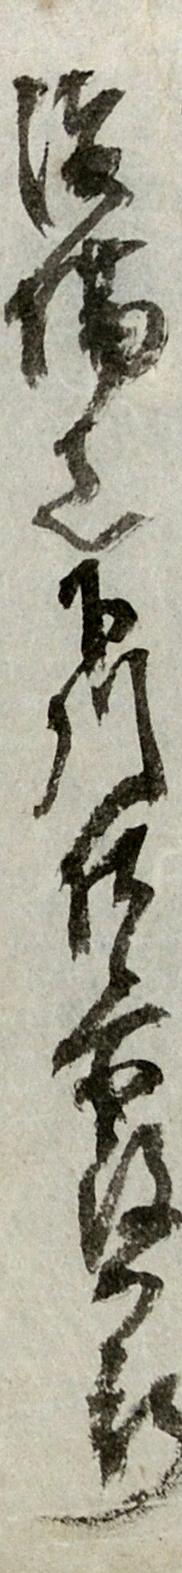渡場迄下川仕候所改御預
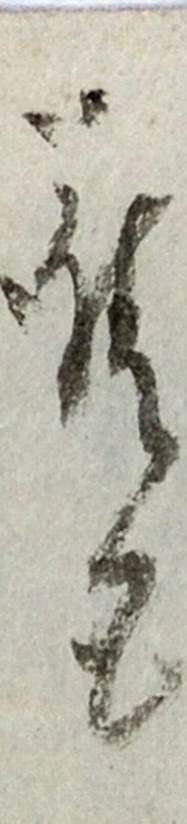御座候以上
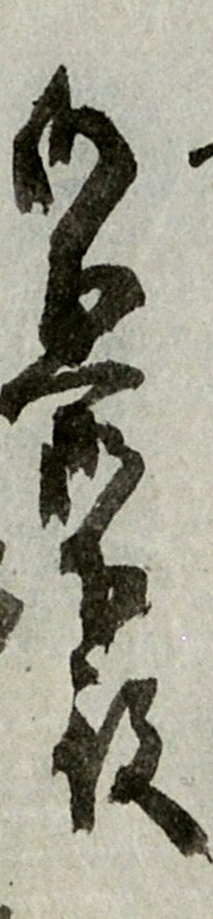御廻御下役
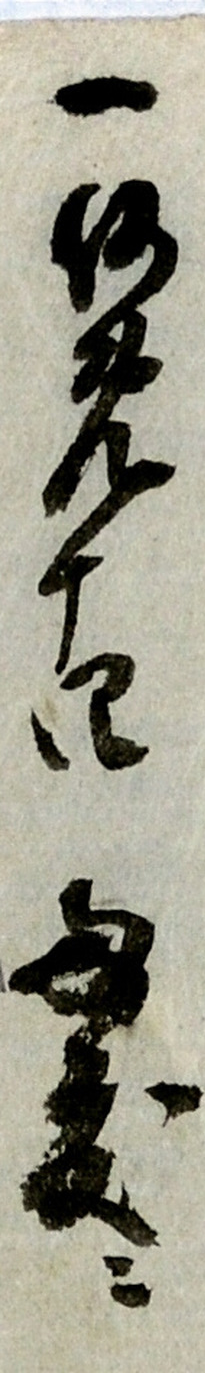一あめ十四両度ニ
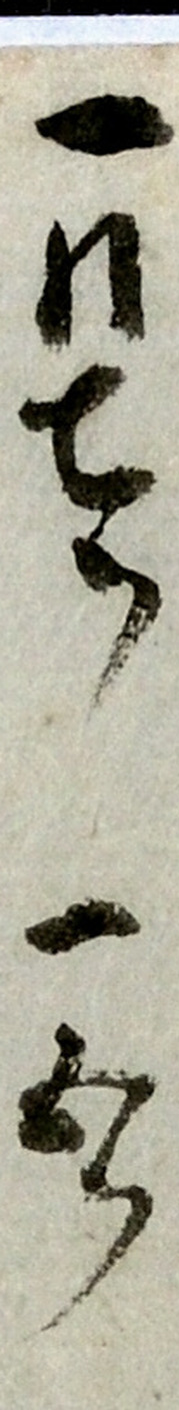一同七ツ一五ツ
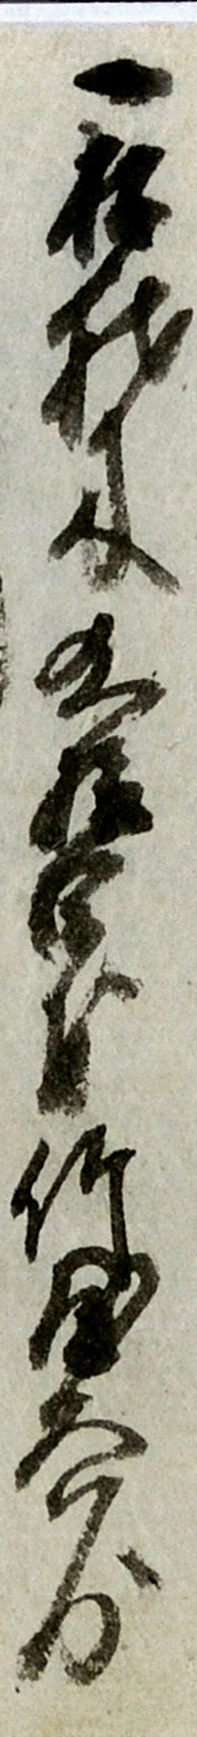一松材木九拾四本竹屋久右衛門
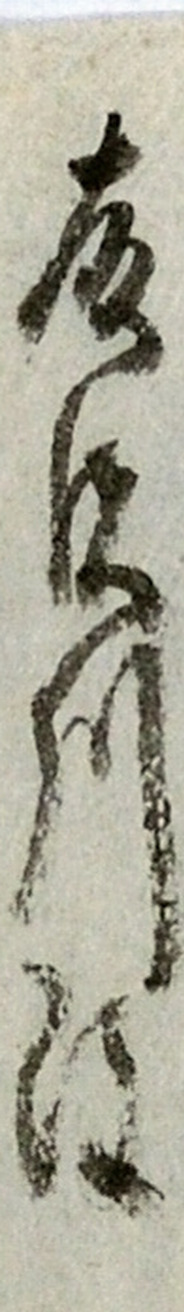藤沢川改
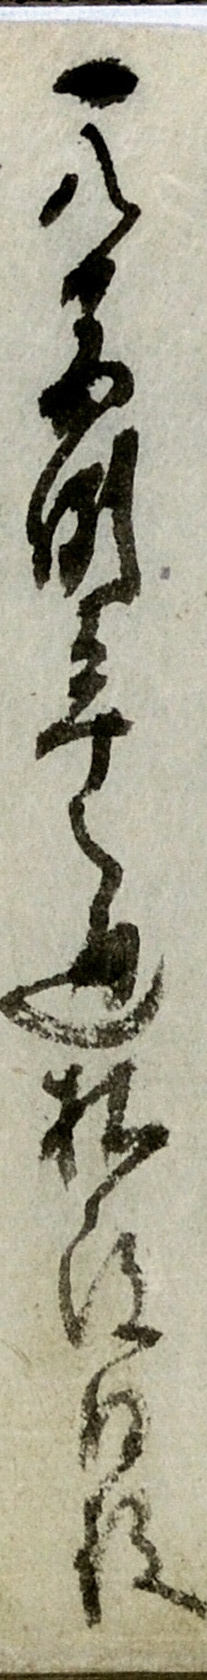一八日ゟ例年之通松改同役
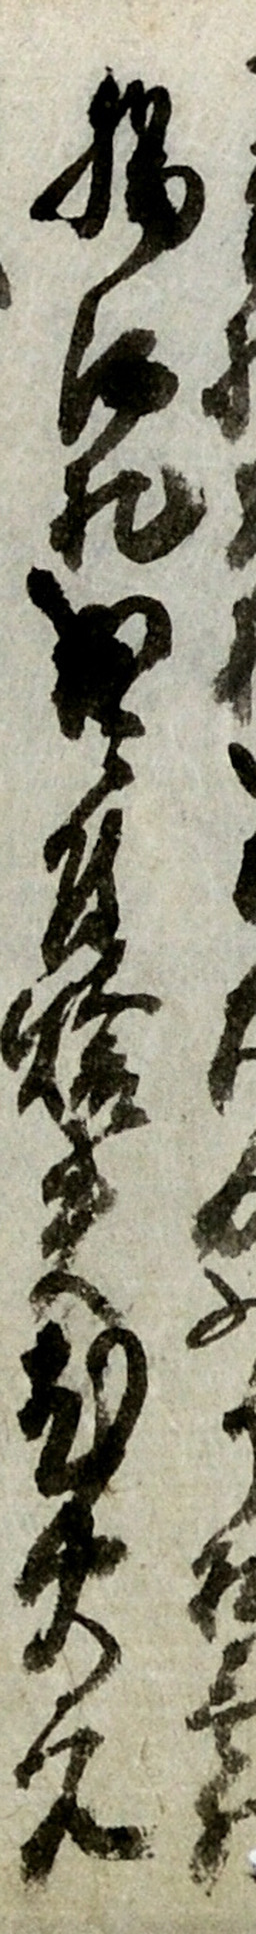揚酒札出候付焼失尤火元
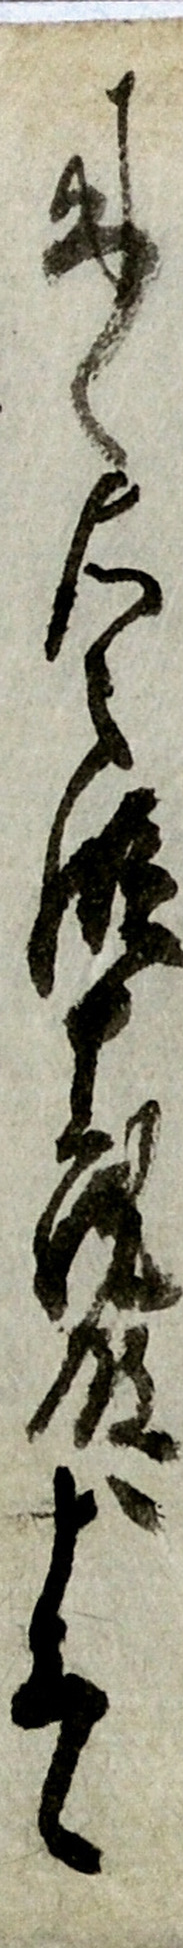来候右之段十蔵殿へ申上候
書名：分一方諸事御用留帳
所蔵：伊那市立高遠町図書館・合同会社AMANE
